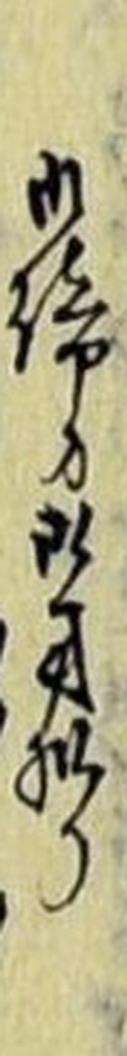御締方御用掛り
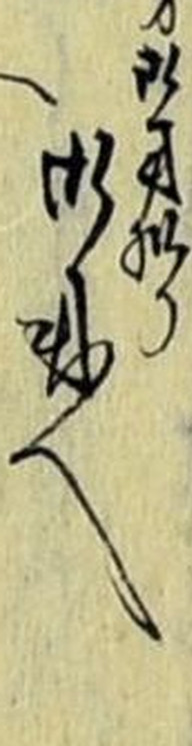御用人
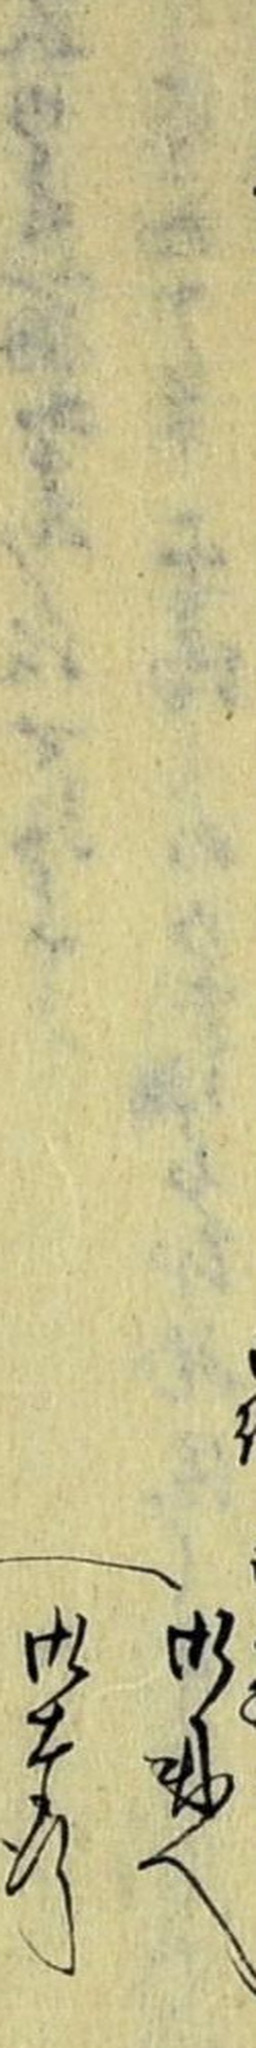御奉行
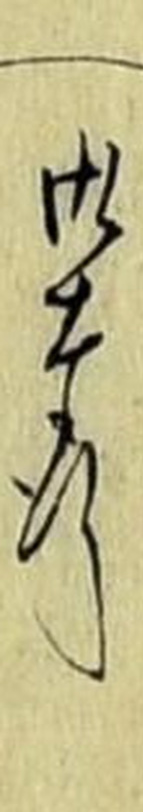御奉行
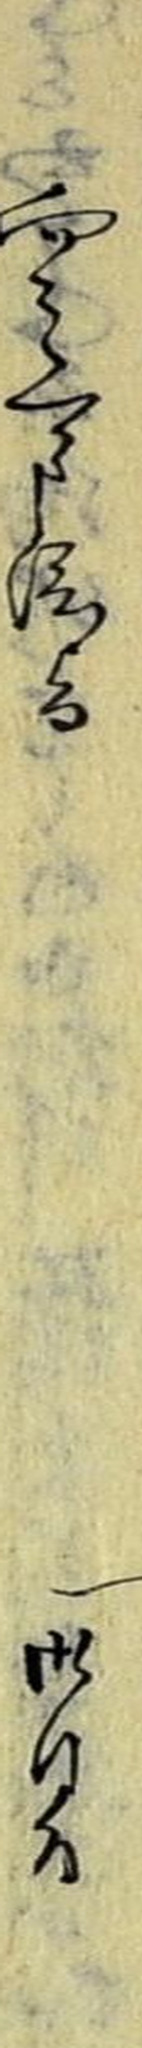向々へ可申渡旨御目付
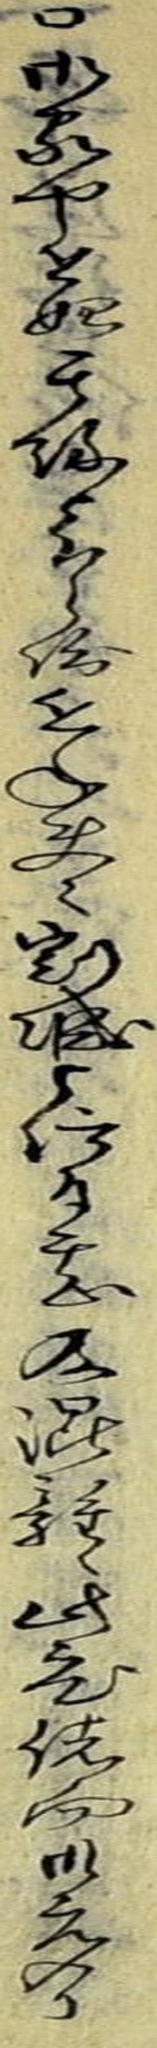○御家中を始其餘被下候儀近年夫々割減被仰付甚及混雑候此度諸向御取〆り
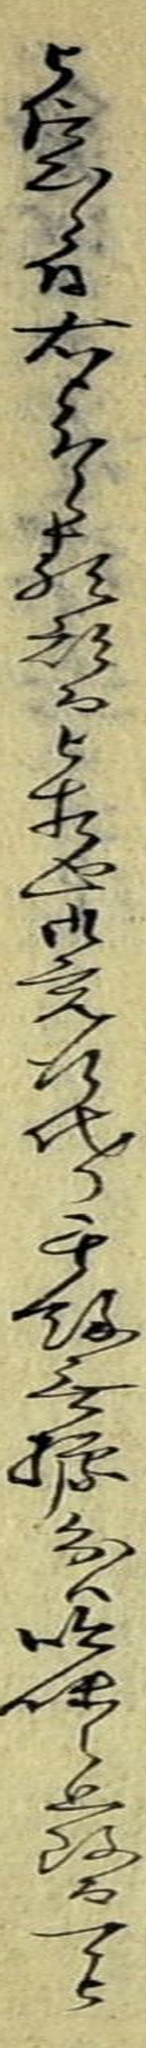被仰出候に付右被下類都而被相止御充行代り其餘無拠分は吟味之上改而可被
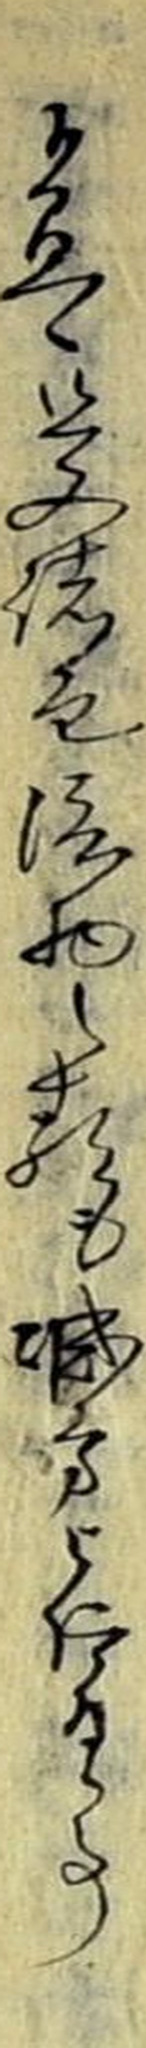下置且又諸色渡物之類も減方被仰付候事
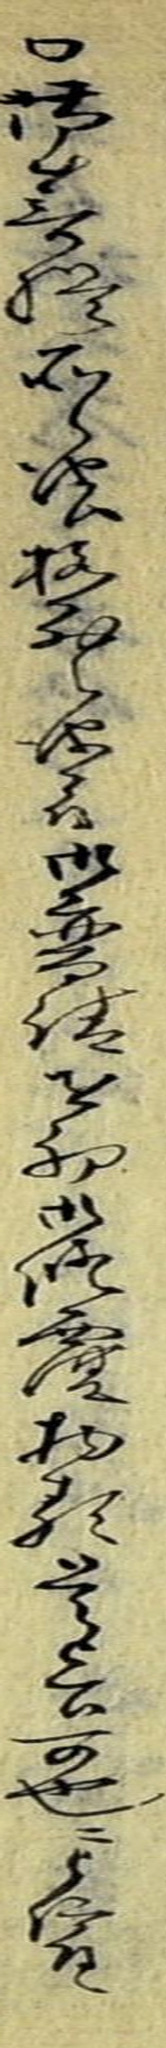○御菩提所之儀は各別之儀に付御普請を初御修覆物類是迄は可也に被仰付候
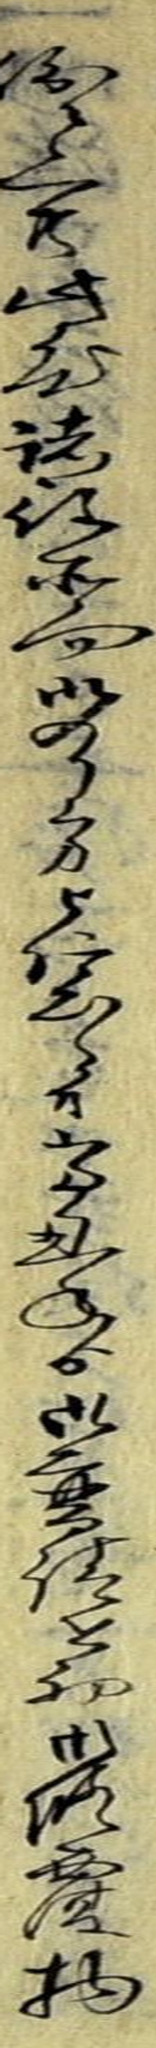儀に候へ共此度諸役所向御〆り方被仰出候に付当丑年ゟ御普請を初御修覆物
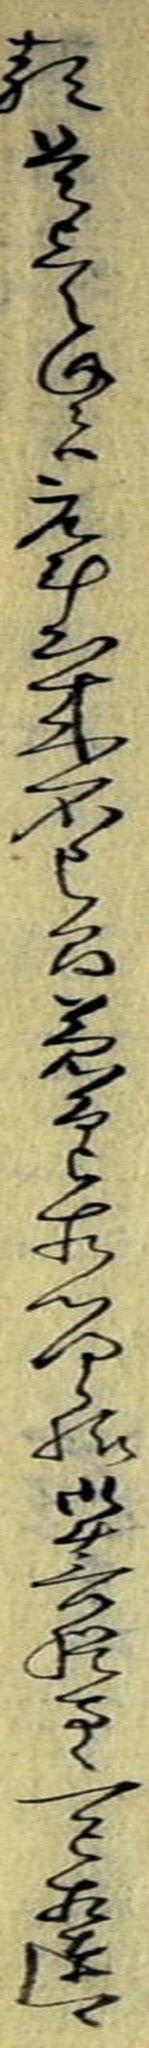類是迄之趣には取斗出来不申候間兼而被相心得候様御菩提寺へ可被相達候

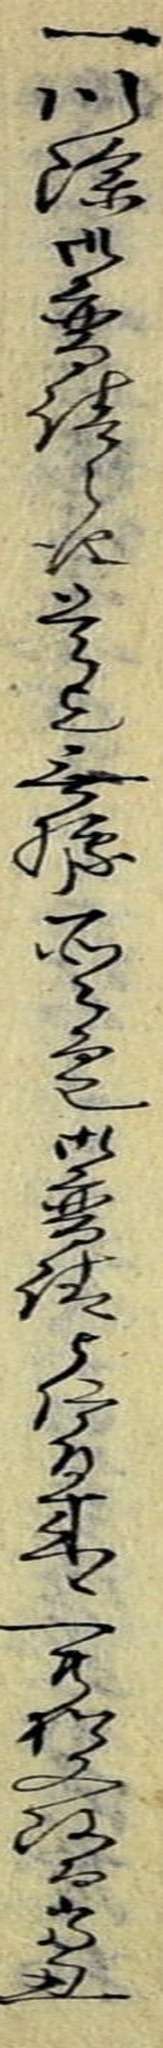一川除御普請之儀是迄無拠所々而己御普請被仰付来候へ共猶又改而当丑
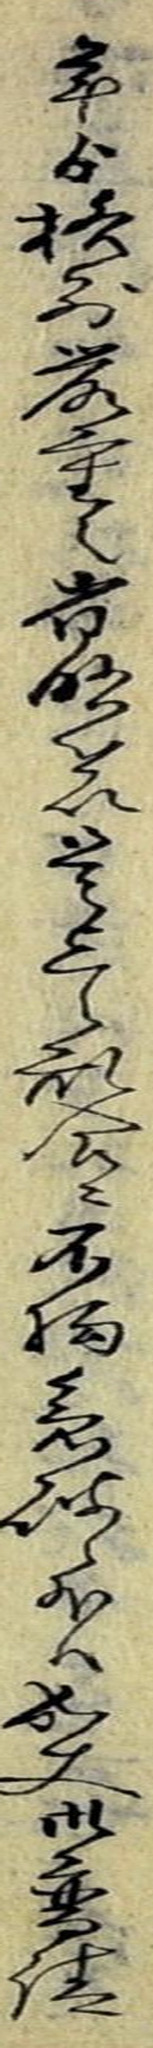年ゟ格別厳重之省略を以是迄之形合に不拘急破之外は成丈御普請
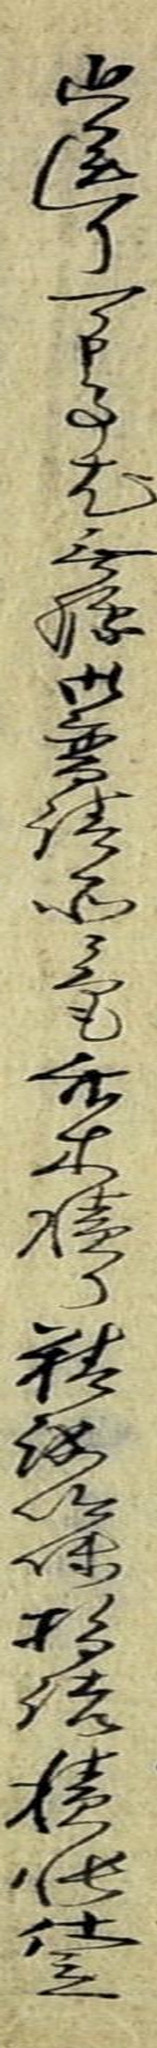追送り可申事尤無拠御普請所に而も竹木積り精誠吟味指詰積帳仕立
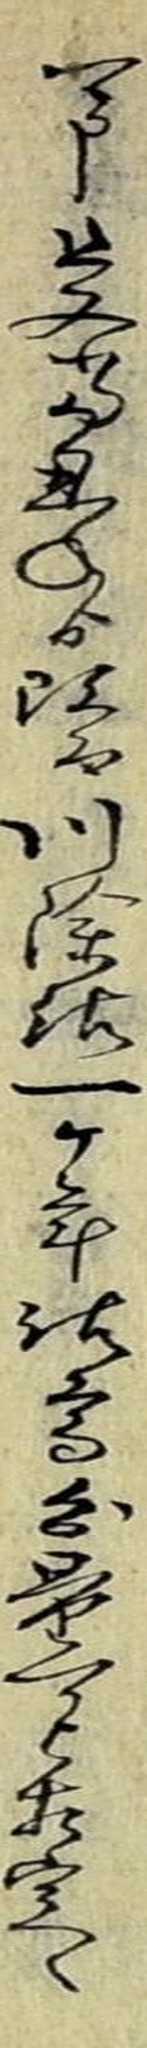可申且又当丑年ゟ改而川除銀一ヶ年銀高分量可被相定候
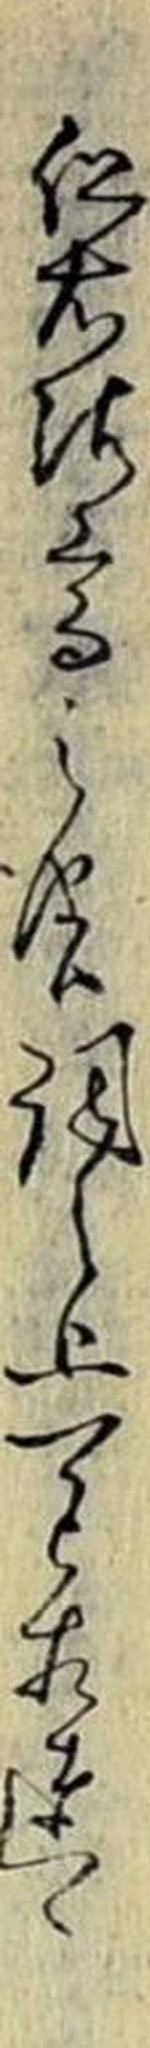但右銀高之儀は調之上可被相達候
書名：命令之部 四
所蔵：福井県文書館 Fukui Prefectural Archives
